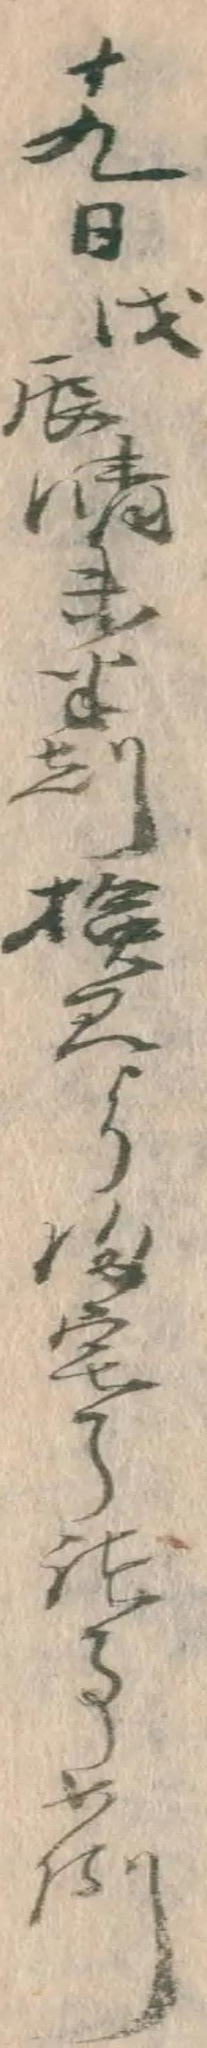十九日戊辰晴未半刻検見より帰宅了諸事如例
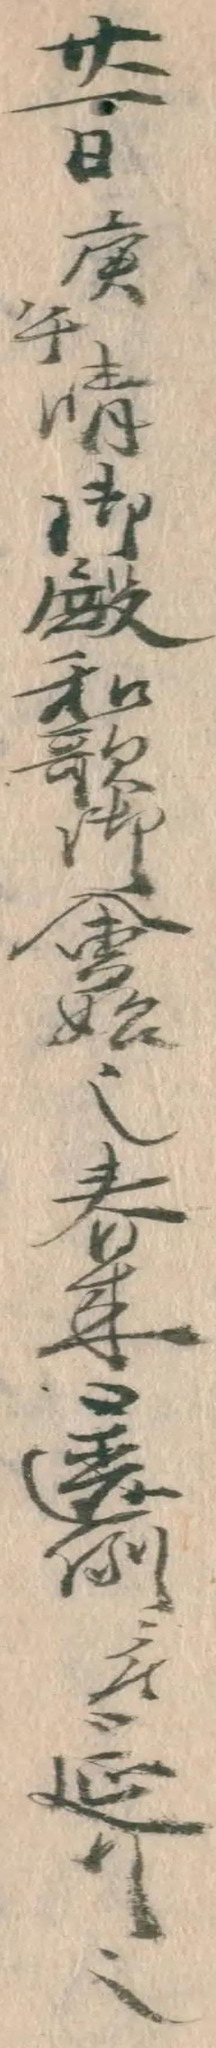廿一日庚午晴御殿和歌御會始也春来御違例ニ付御延引也
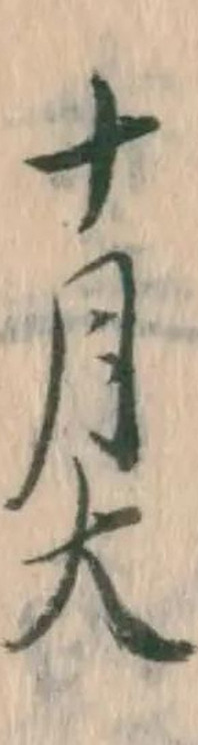十月大
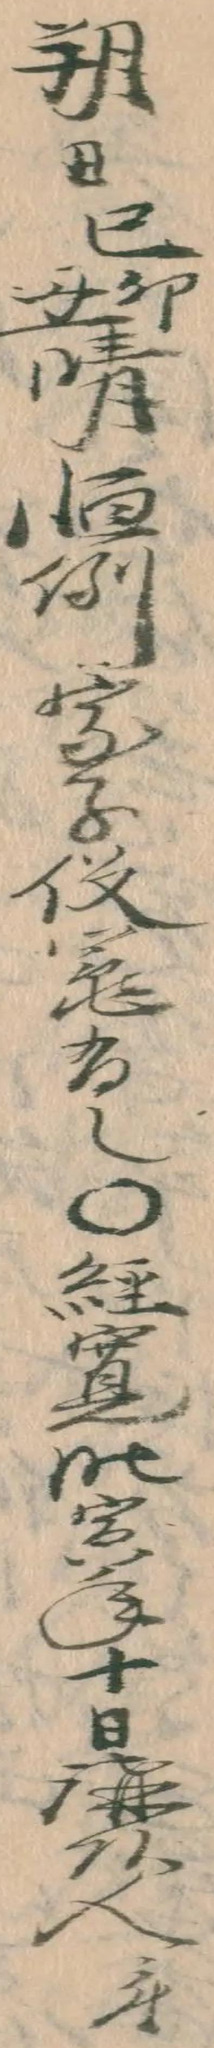朔日己卯晴恒例家子役鬮有之〇経寛昨寅年十日講頭人ニ付
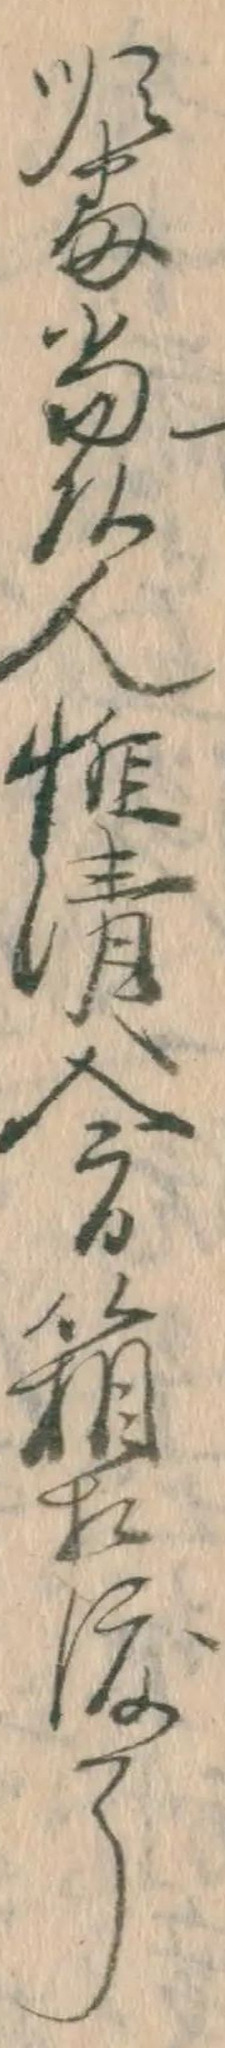順番當頭人惟清ヘ今日箱相渡了
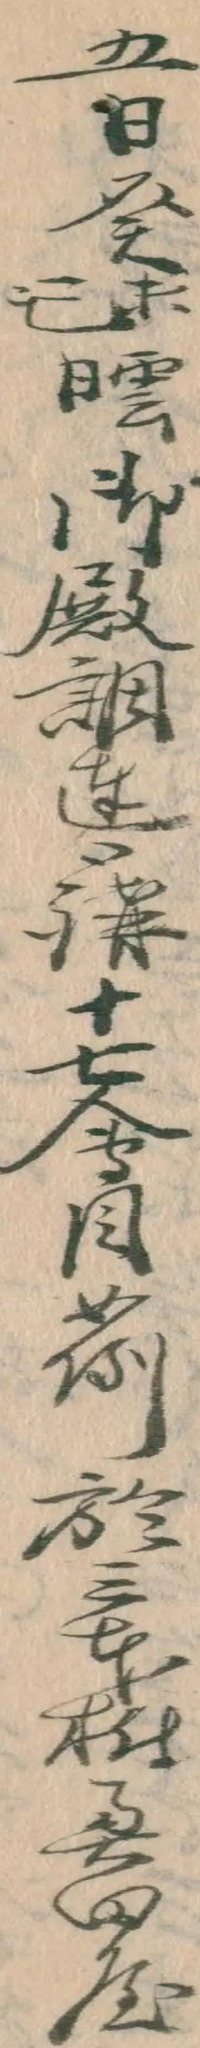五日癸未曇御殿調達御講十七會目如例於三本樹奥田屋
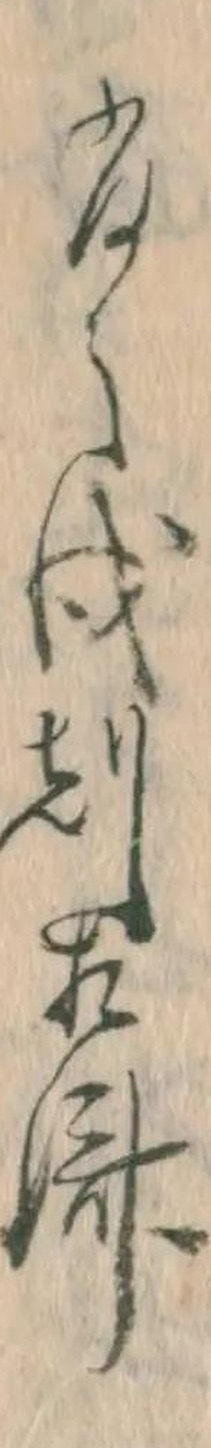有之戌刻相済
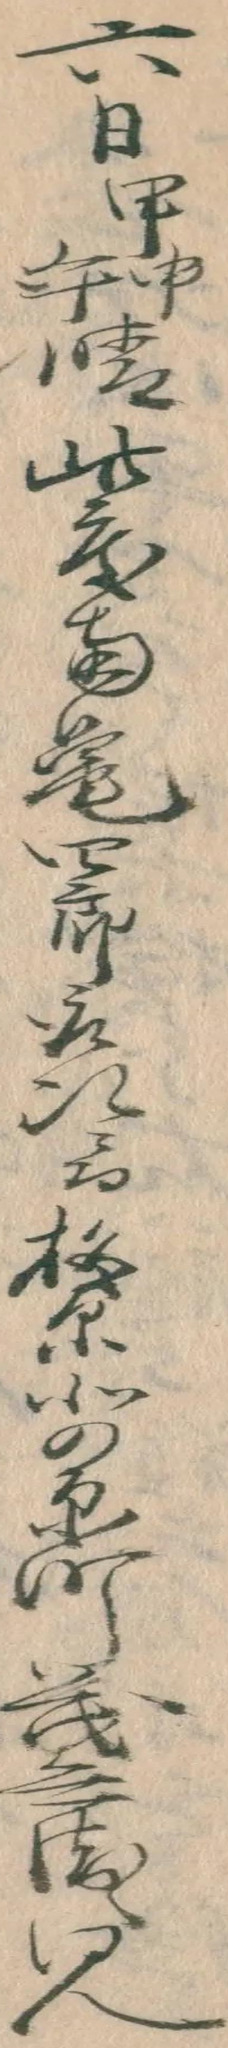六日甲申晴此度南亀四郎取次ニ而柳原北の原町茂兵衛同人
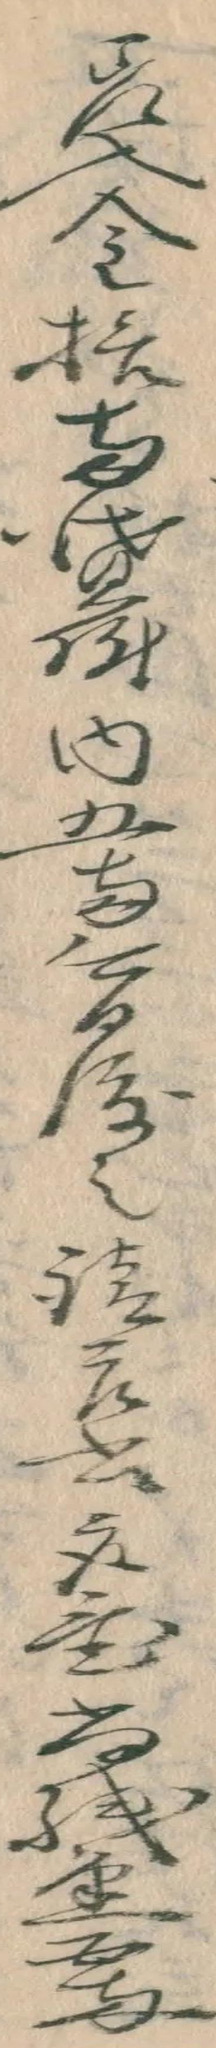差入金拾両貸附内五両今日渡之請取書取置尚残金五両
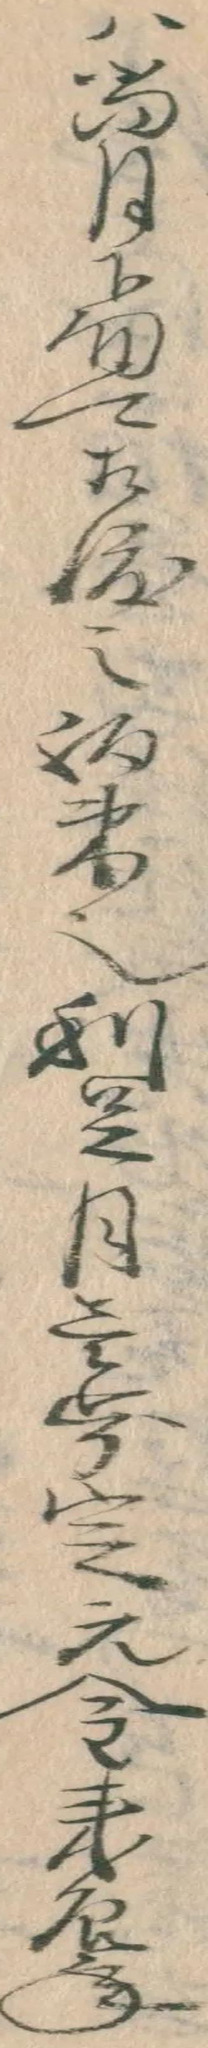ハ當月下旬可相渡之約束也利足月壱歩定元金来辰年
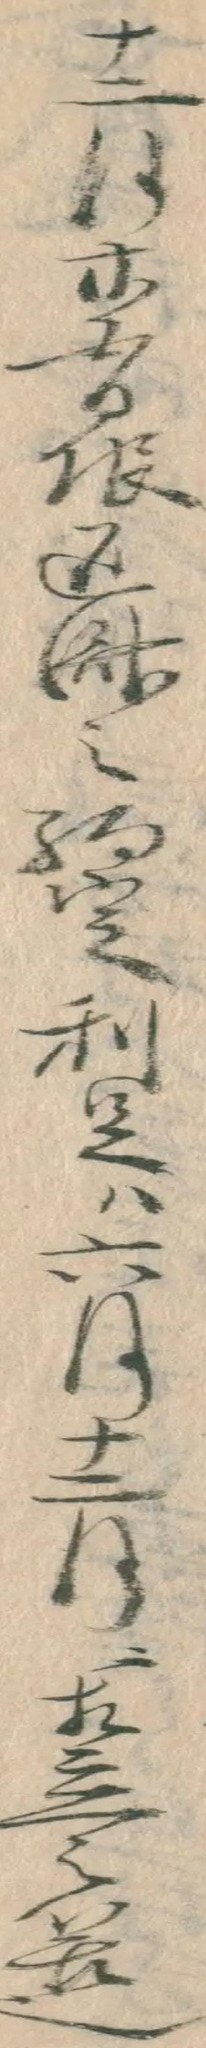十二月廿五日限返済之約定利足ハ六月十二日ニ相立之筈也
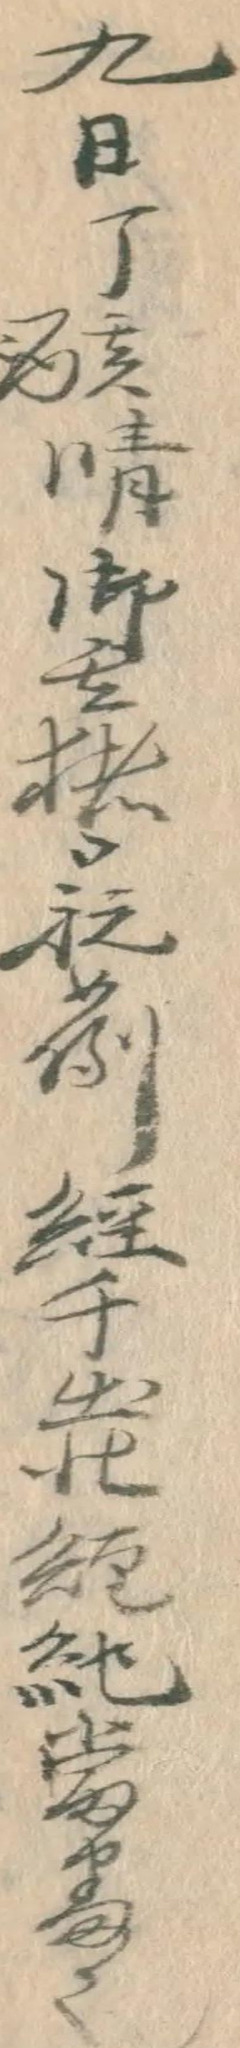九日丁亥晴御玄猪御祝如例経千出仕経紀當番也
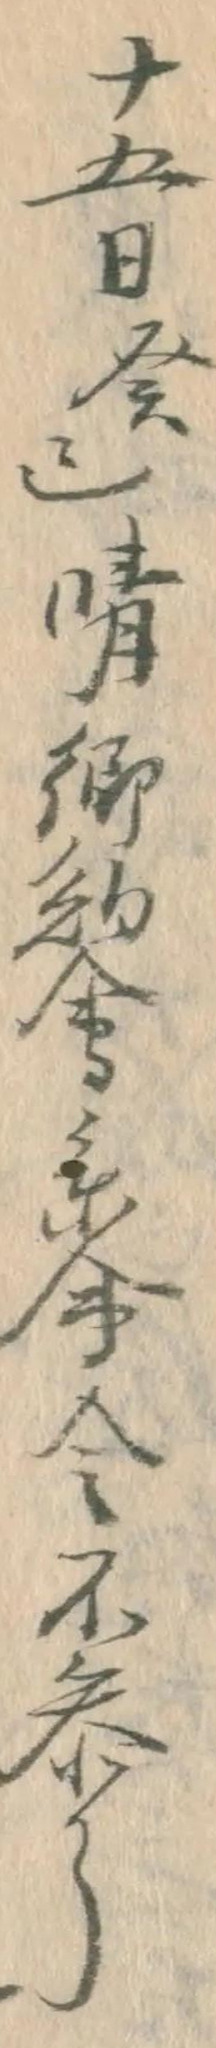十五日癸巳晴郷約会参会不参了

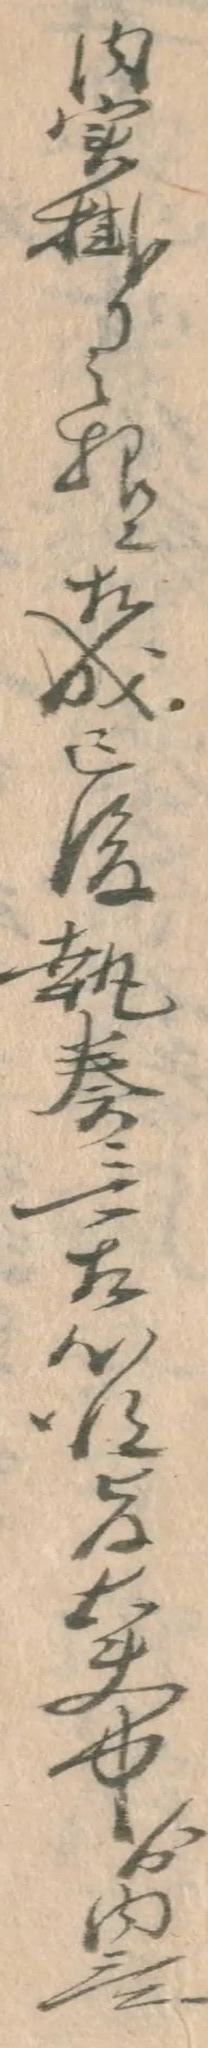内実掛リ之様に相成已後執奏ニ可相心得旨大夫中ゟ内意
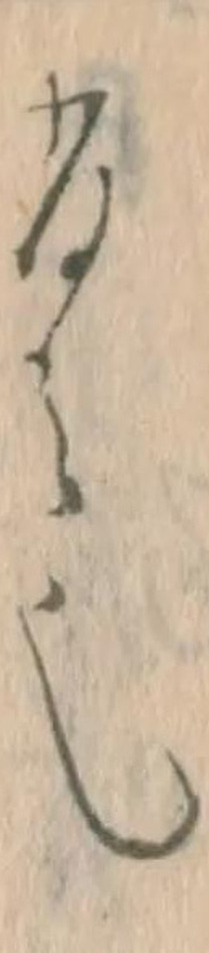有之也
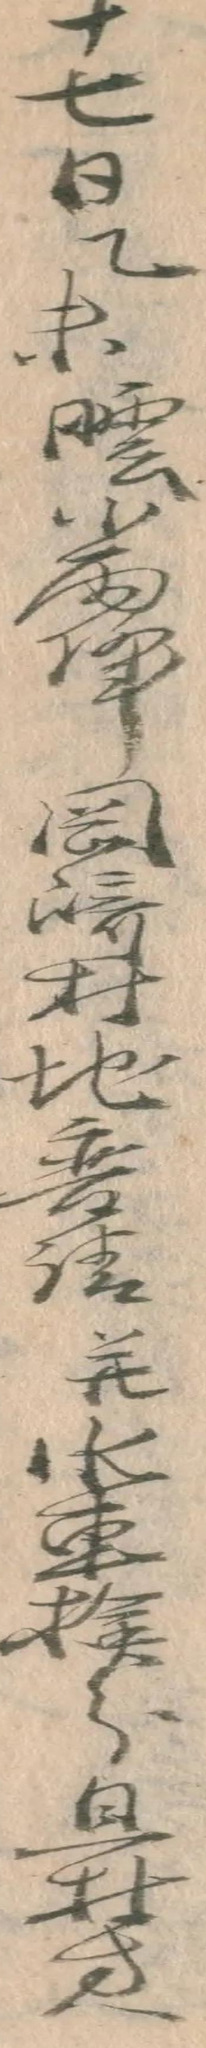十七日乙未曇小雨降岡崎村地普請并水車検分且村方へ
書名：賀茂社記録. 第66冊
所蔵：国立国会図書館 National Diet Library, JAPAN
